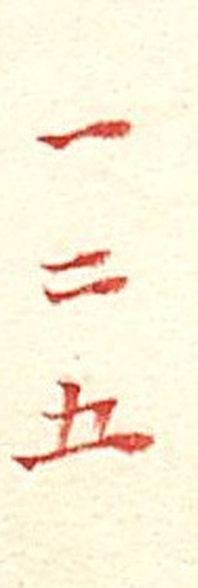一二五
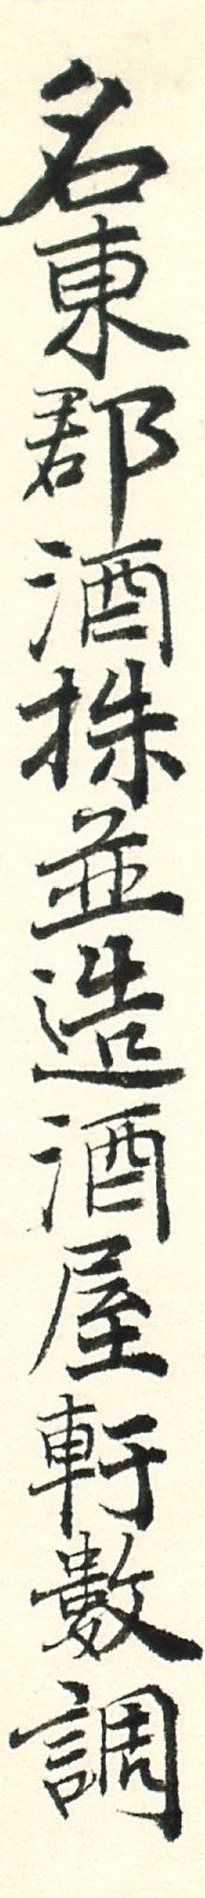名東郡中酒株並造酒屋軒数調
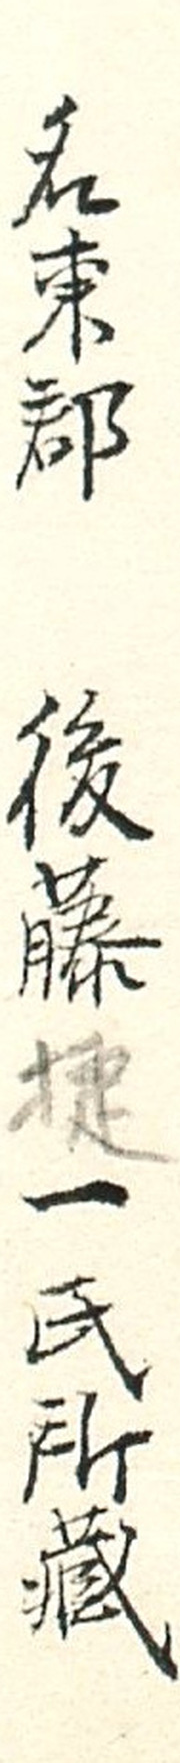名東郡後藤捷一氏所蔵

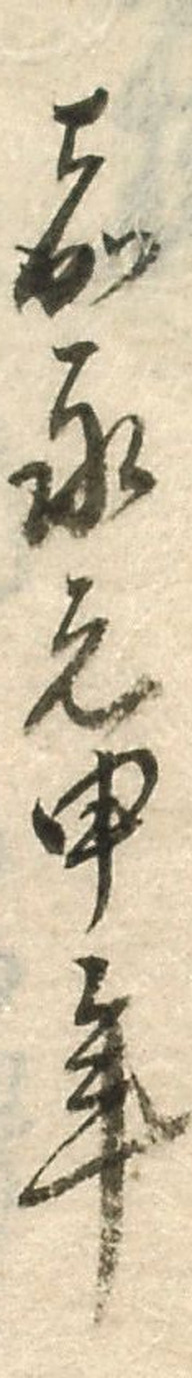嘉永元申年
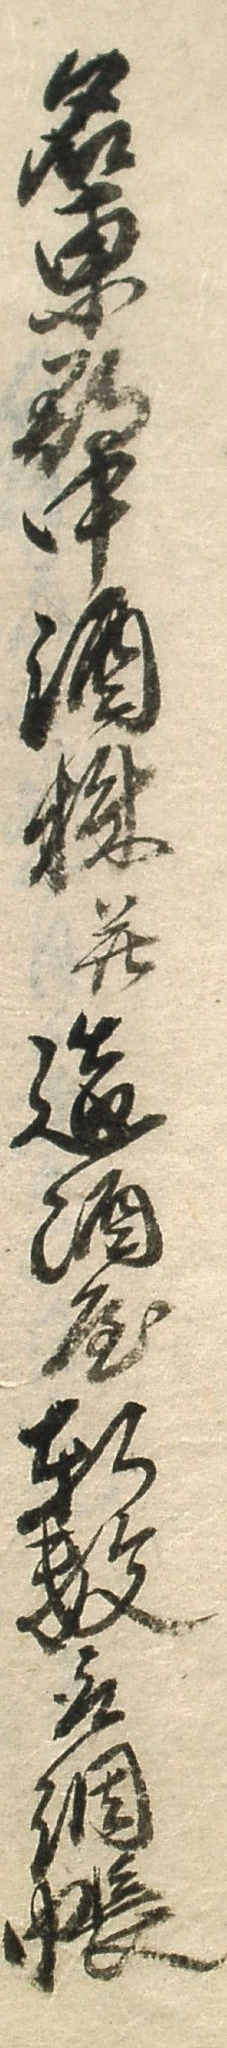名東郡中酒株並造酒屋軒数取調帳
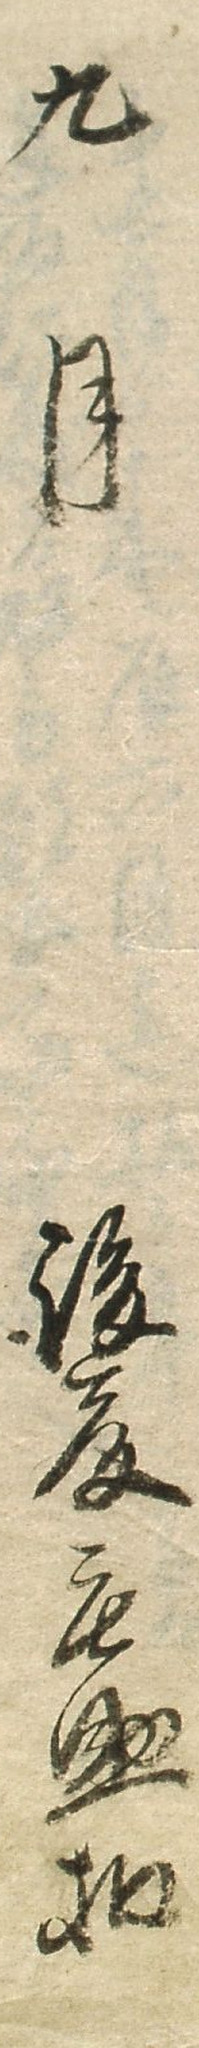九月後藤庄助扣

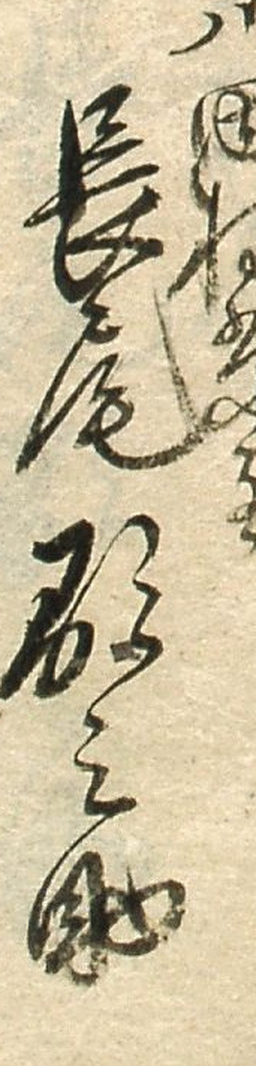長尾郡之助
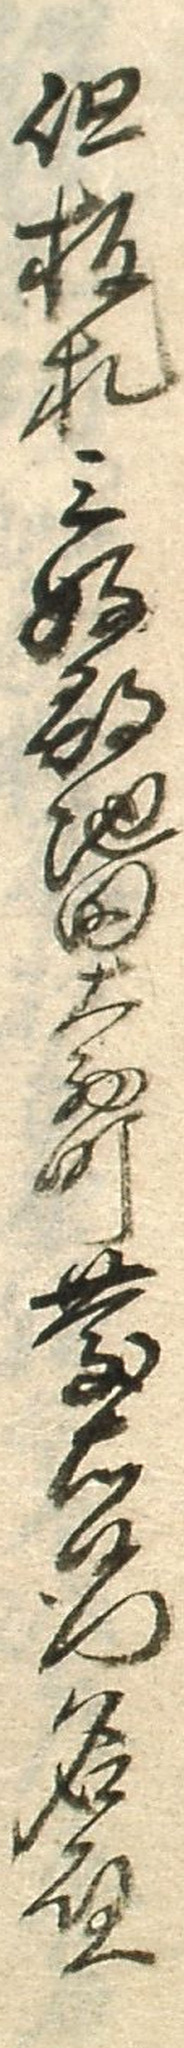但板札三好郡池田大西町慶右衛門名
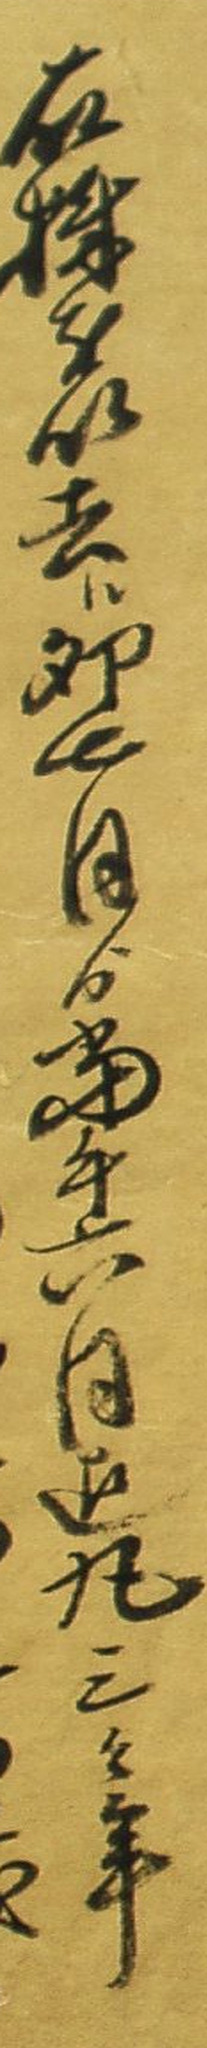右株を以去る卯七月より当午六月迄丸三ヶ年
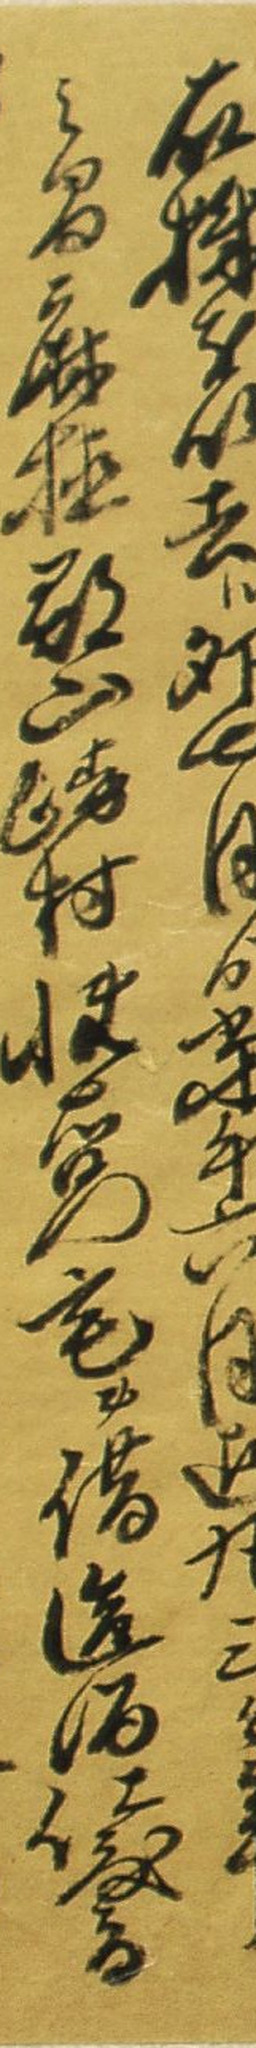之間麻植郡山崎村快右衛門宅を借造酒仕度旨
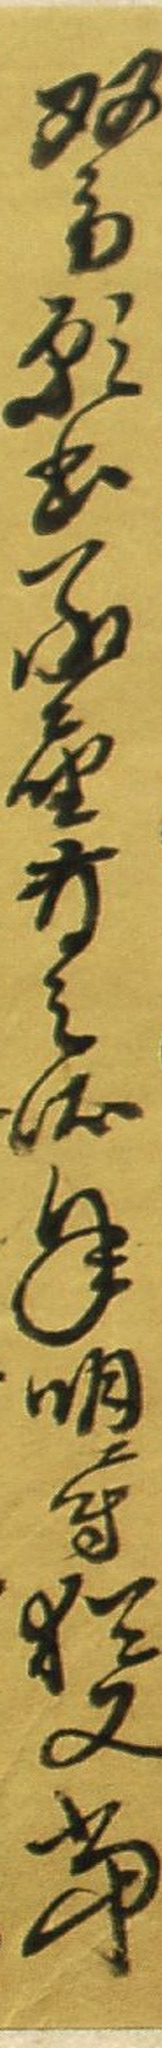双方願出承届有之所年明に付猶又当
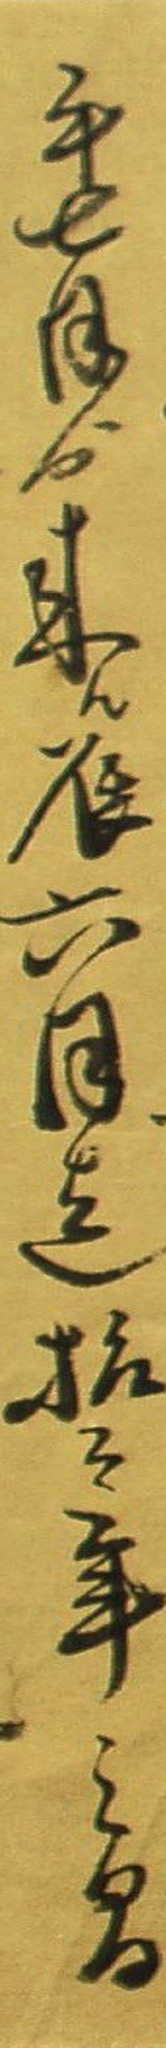年七月より来る辰六月迄十ヶ年之間
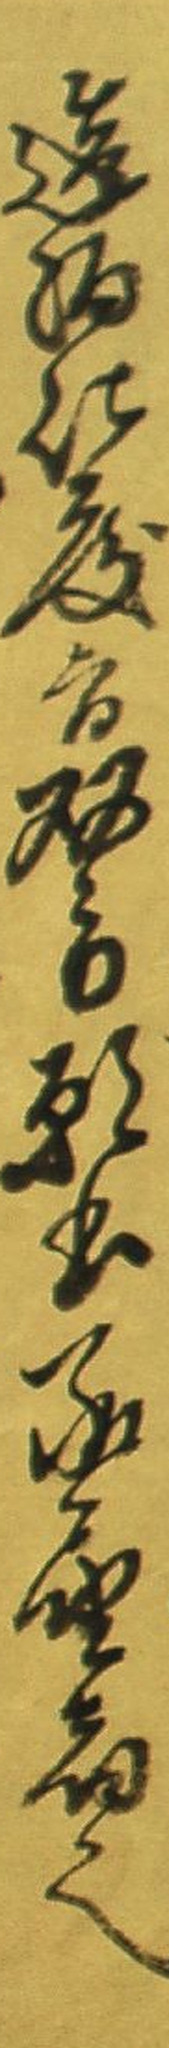造酒仕度旨双方願出承届者也
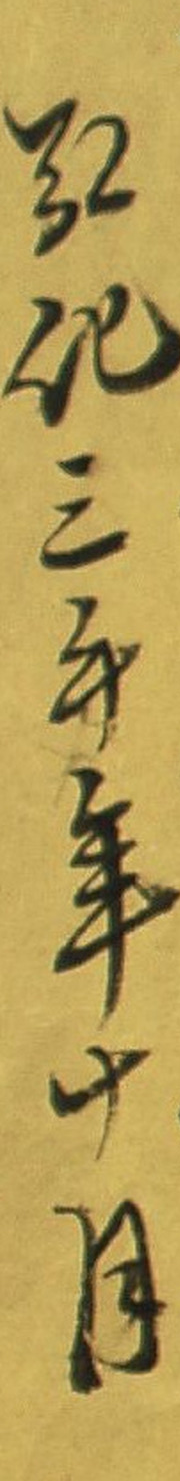弘化三午年十月

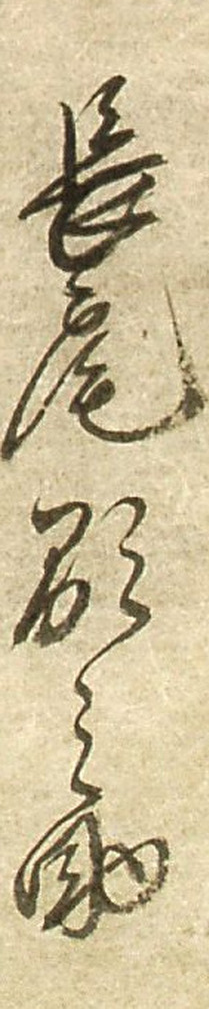長尾郡之助
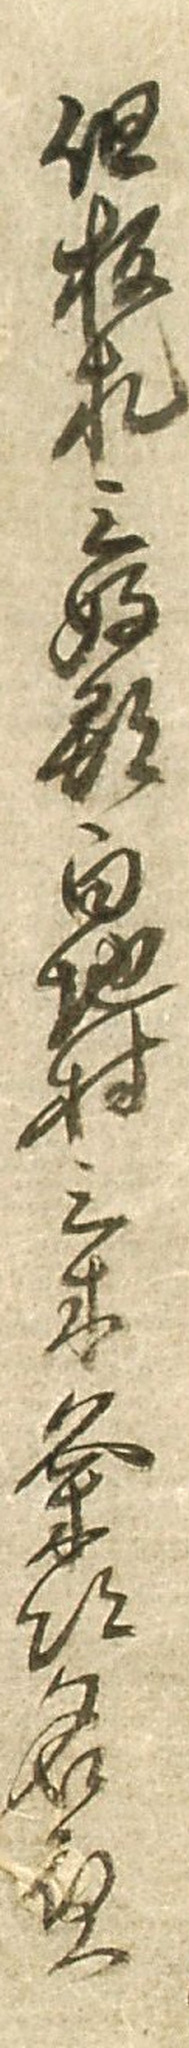但板札三好郡白地村三木粂次名
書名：名東郡中酒株並造酒屋軒数取調帳
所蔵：鳴門教育大学 Naruto University of Education
